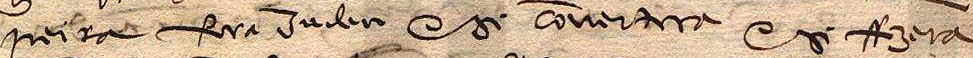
rreira fora Judeu e se c̄ouertera e se ffezera
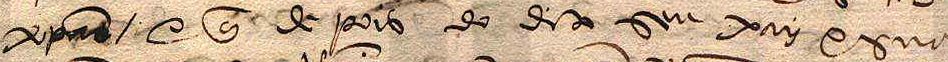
xpão / e q̄ depois do dito seu pay e sua
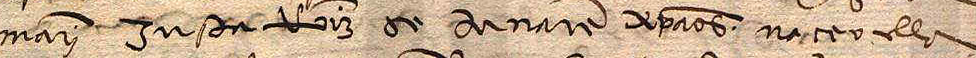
mãy Justa Rōiz se tornarē xpãos. naçeo ella
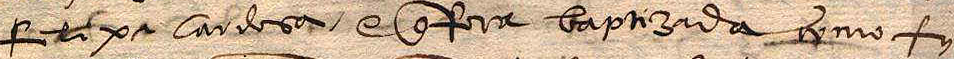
felipa Cardosa / e q̄ fora baptizada como fy
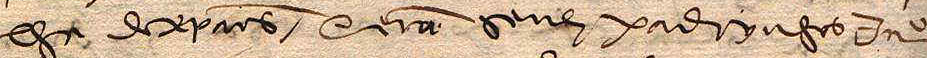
lha de xpãos / e erā seus padrynhos Jmo
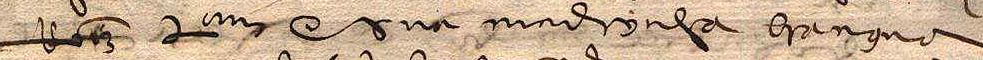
Roīz tam e sua madrynha branqua
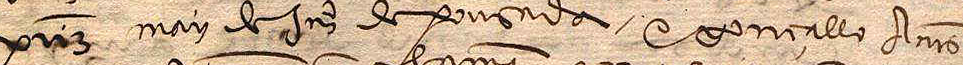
pr̄iz may de Jmo de pousada / e gonçallo An̄es
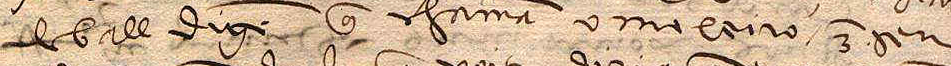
de balldīgem q̄ chamā o moleiro / item sem
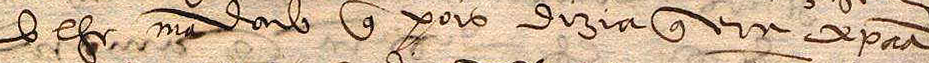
do lhe m̄adado q̄ pois dizia q̄ era xp̄aa
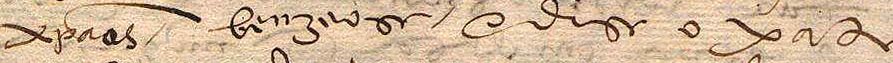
xpãos / benzeose / e dise o pater
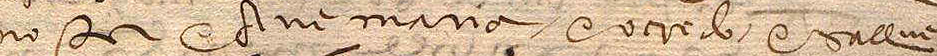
noster e Aue maria / e o credo / e sallue
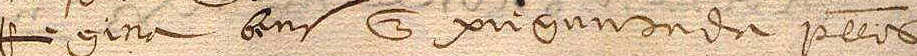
Regina bem item preguntada pl̄los
